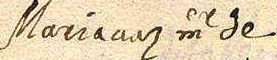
Maria uaz mer de
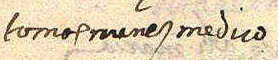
tomas nunes medico
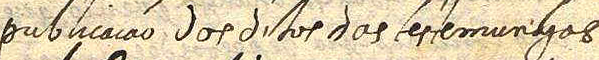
publicacaõ dos ditos das testemunhas
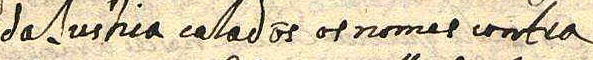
da Justica calados os nomes contra
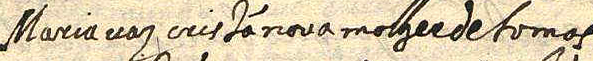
Maria uaz cristā noua molher de tomas
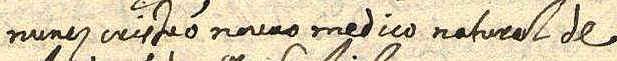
nunez cristaõ nouo medico natural de
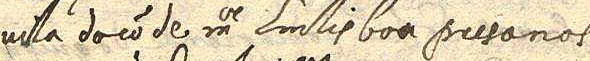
uilla do cōde mor Em lisboa presa nos
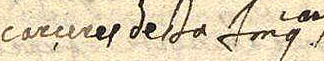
carçeres desta Imq.cam
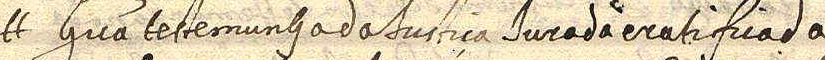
item huā testemunha da Iustiça Iurada e ratificada
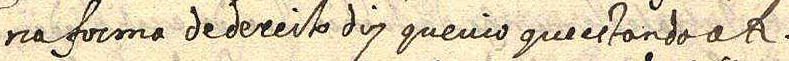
na forma de dereito diz que uio que estando a R.
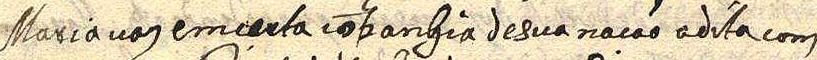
Maria uaz em çerta cōpanhia de sua naçaõ a dita com
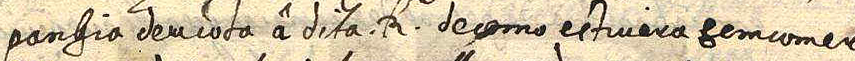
panhia deu cōta â dita .R. de como estiuera sem comer
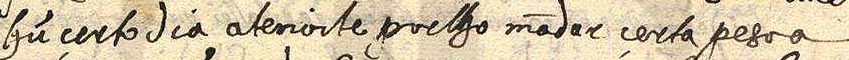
hū çerto dia ate noite por lho mādar çerta pesoa
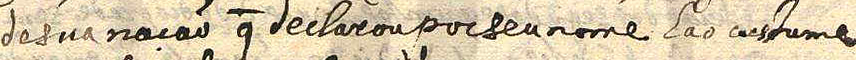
de sua naçaõ q̄ declarou por seu nome E ao custume
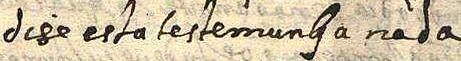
dise esta testemunha nada
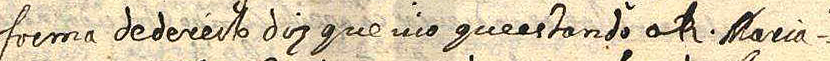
forma de dereito diz que uio que estando a R. Maria
